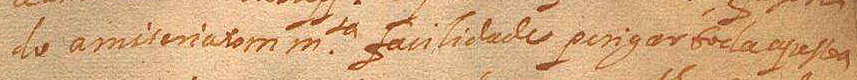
do a miseria com m.ta facilidade perigar toda a pessoa
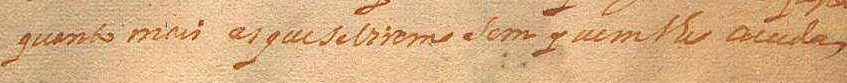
quanto mais as que se virem sem quem lhe acuda
